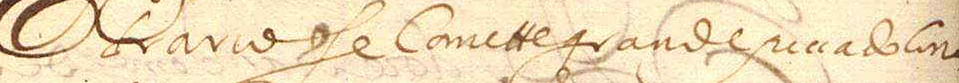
trario se Comette grande peccado Con
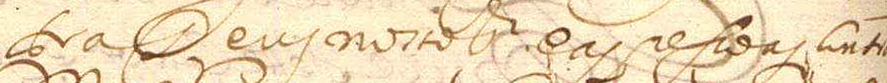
tra Deus nosso sor e as pessoas Contra
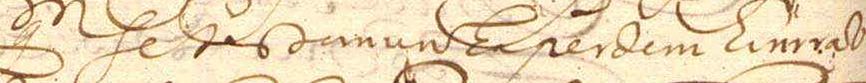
qm se testemunha perdem honrrados
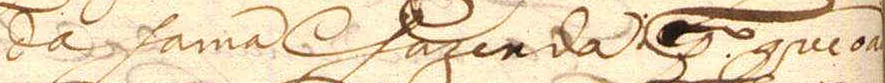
da fama e fazenda p.lo que o a
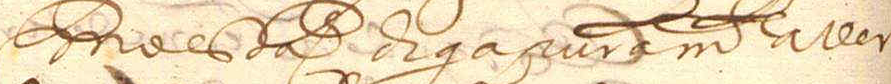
moestaõ diga puram.te a ver
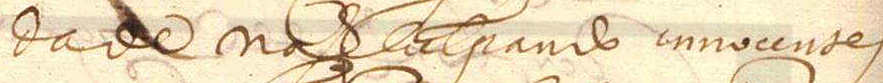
dade naõ culpando innocentes
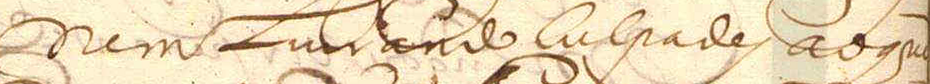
nem Liurando Culpados ao que
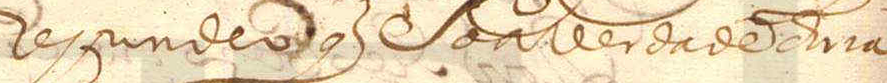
Respondeo q̄ So a verdade diria
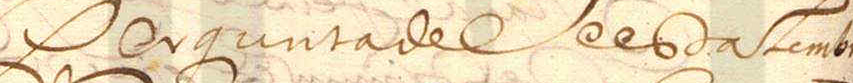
Perguntado Se esta Lembra
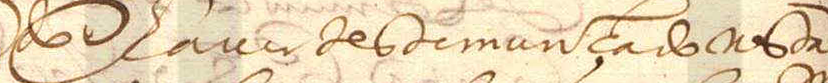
do hauer testemunhado nesta
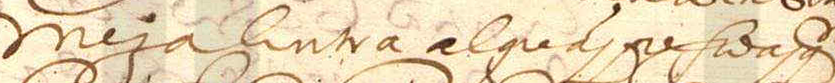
meza Contra alguās pessoas qm
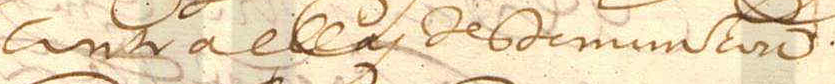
contra ellas testemunhou.
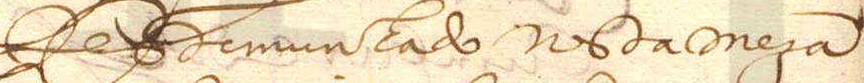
testemunhado nesta meza
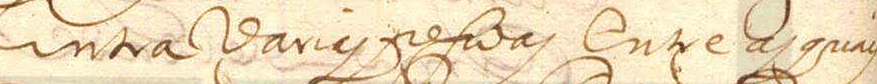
Contra varias pessoas Entre as quais
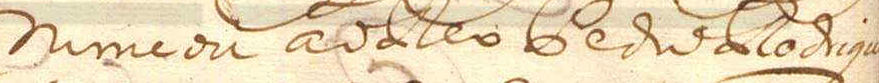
numeou ao Reo Pedro Rodrigu
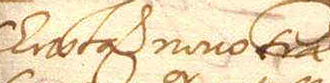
Chistaõ nouo tra
